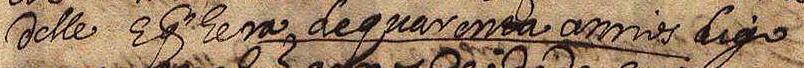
delle E q̄ hera de quarenta annos digo
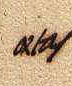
ætas
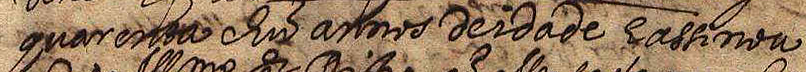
quarenta e hū annos de idade E assinou
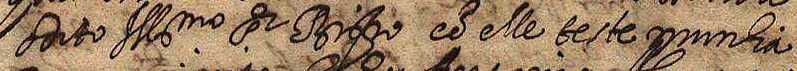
o dito Jllm.o s.or Bispo cō elle testemunha
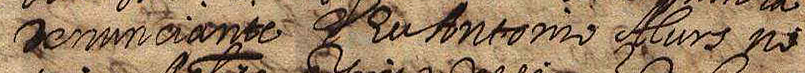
denunciante E Eu Antonio Alurs no
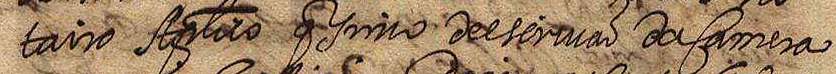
tairo Ap̄lico q̄ siruo de escriuaõ da Camera
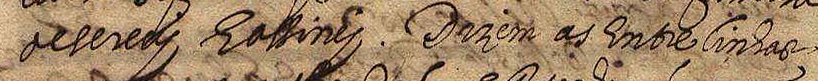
o escreuj E assinej. Dizem as Entrelinhas
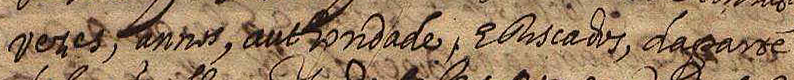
vezes, annos, authoridade, e Riscados, da parte
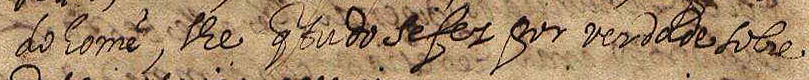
do homē, lhe q̄ tudo se fez por verdade sobre
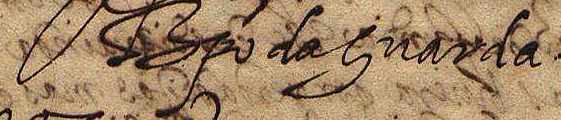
O Bpō da Guarda.
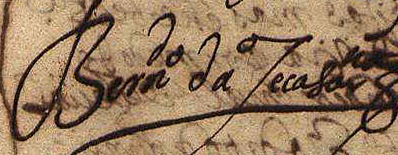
Berndo daoseca sarua
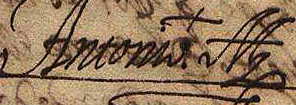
Antonio Al̄z
